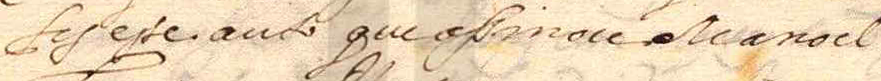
fes este auto que assinou Manoel
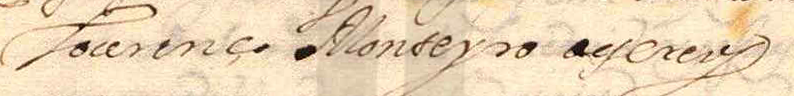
Lourenço Monteyro o escrevj
